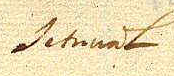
setuuaL
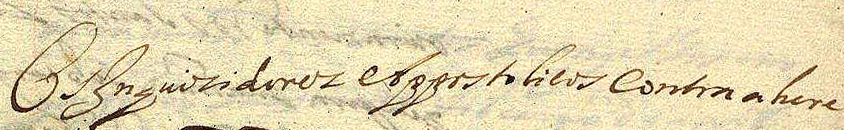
Os Inquizidorez Appostolicos contra a here
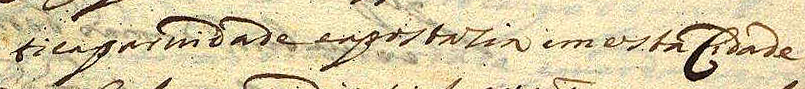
tica paruidade e apostazia em esta Cidade
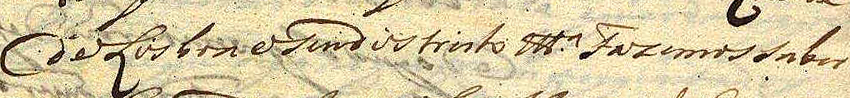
de Lisboa e seu districto ett.a Fazemos saber
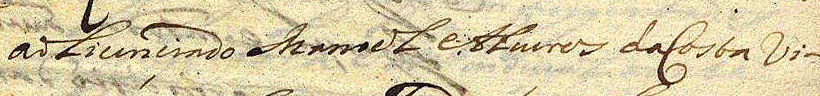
ao Licenciado Manoel Alueres da Costa vi
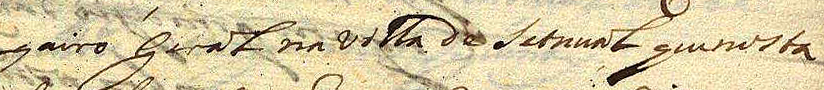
gairo Geral na villa de Setuual que nesta
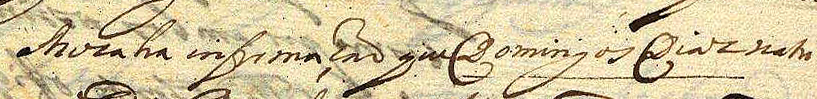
Meza há informação que Domingos Diaz natu
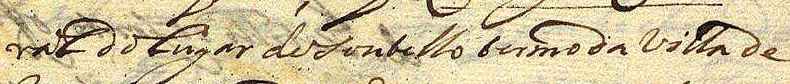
ral do lugar de soutello termo da villa de
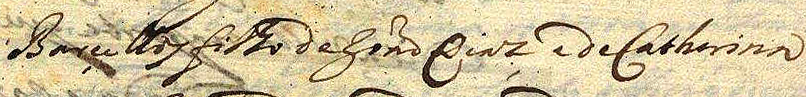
Barcellos filho de Joaõ Diaz, e de Catherina
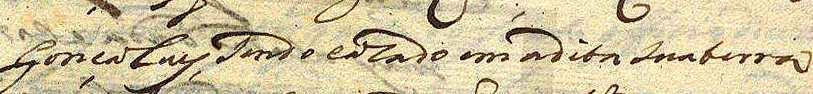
Gonçalues sendo cazado em a dita sua terra
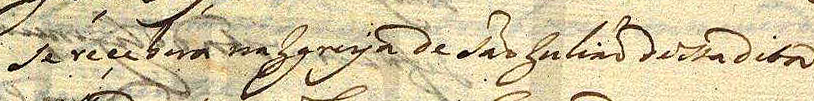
se recebera na Jgreya de saõ Juliaõ desta dita
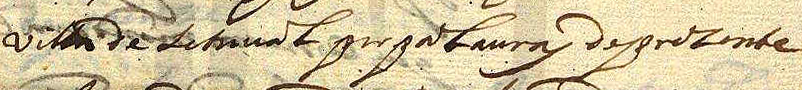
villa de setuual por palauras de prezente
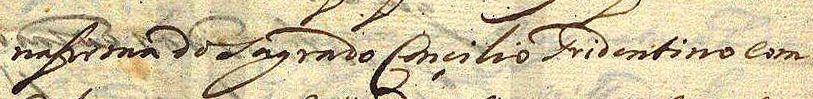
na forma do Sagrado Concilio Tridentino com
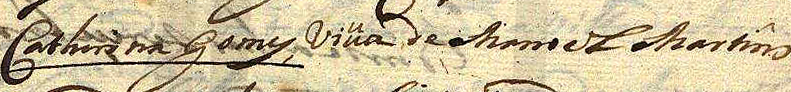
Catherina Gomes, viuua de Manoel Martins
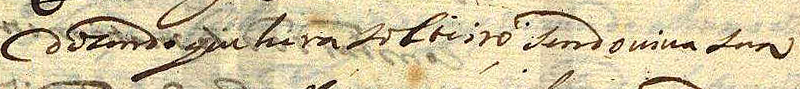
dizendo que hera solteiro, sendo uiua sua
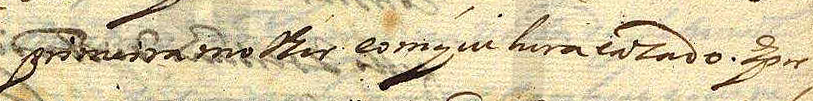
primeira molher com que hera cazado. E por
